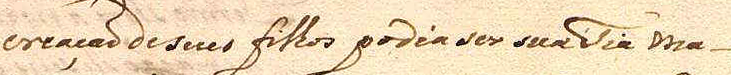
creação de seus filhos podia ser sua Tia ma
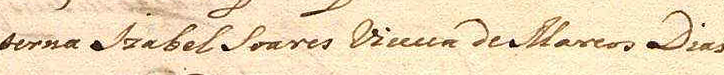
terna Izabel Soares Viuua de Marcos Dias
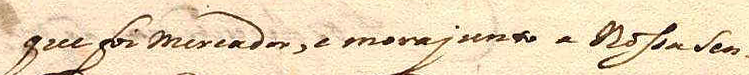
que foi mercador, e mora junto a Nossa Sen
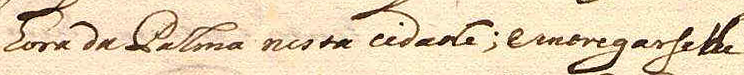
hora da Palma nesta cidade; emtregarselhe
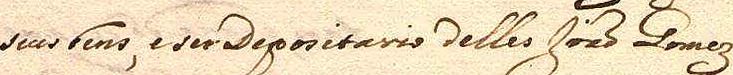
seus bens, e ser Depositario delles Joaõ Gomez
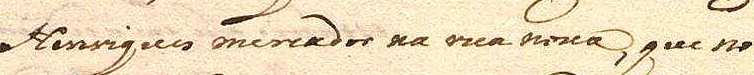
Henriques mercador na rua noua, que no
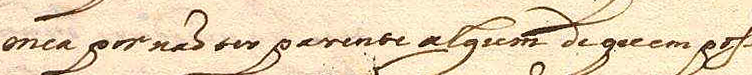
mea por naõ ter parente algum de quem pos
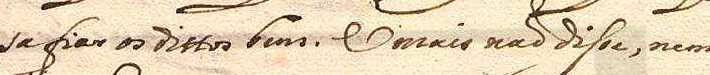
sa fiar os dittos bens. E mais naõ disse, nem
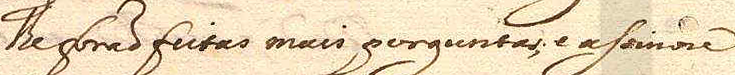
lhe foraõ feitas mais perguntas; e assinou
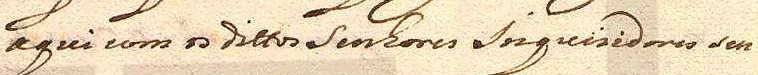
aqui com os dittos Senhores Inquisidores sen
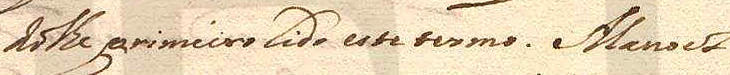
dolhe primeiro lido este termo. Manoel
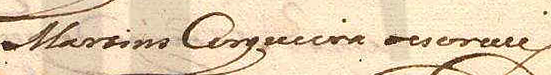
Martins Cerqueira o escreui
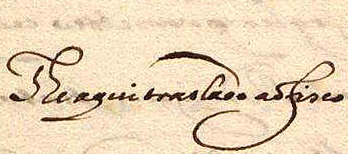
The aqui traslado ao Fisco
